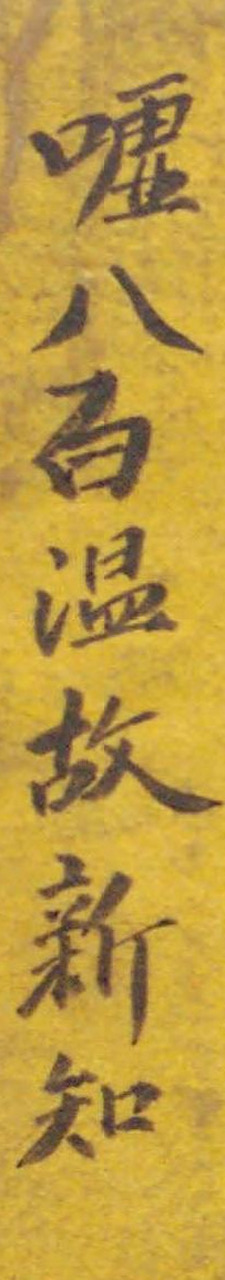嘘八百温故新知

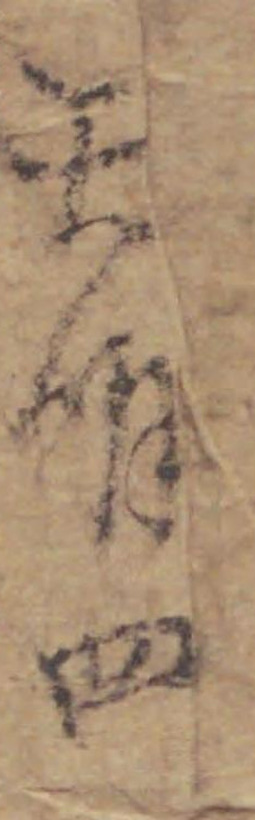天明四
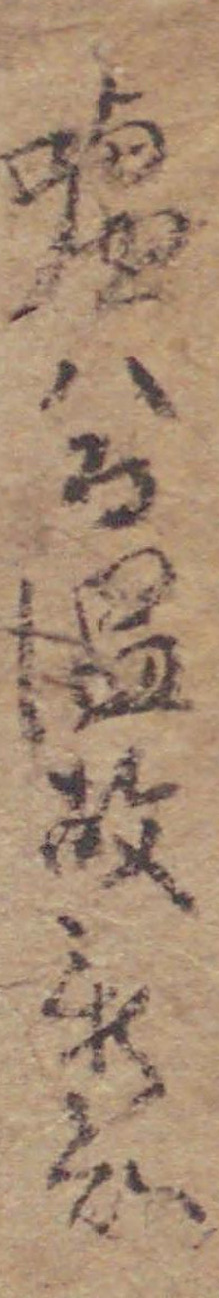嘘八百温故新知

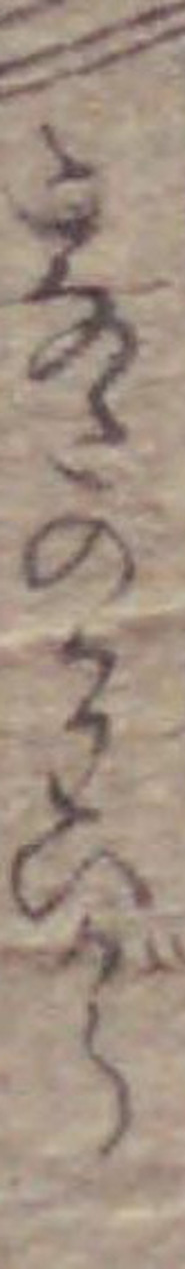こなたのかわいがら
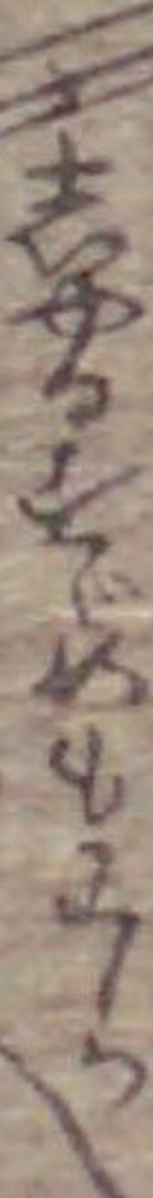しやるすゞめもわしか
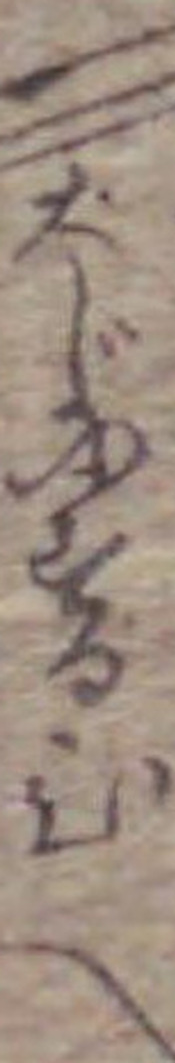大じにするひ

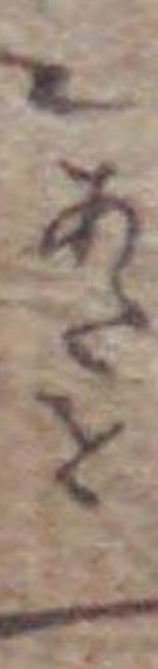あたを
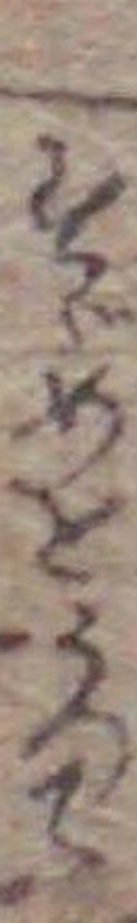すゞめをうつて

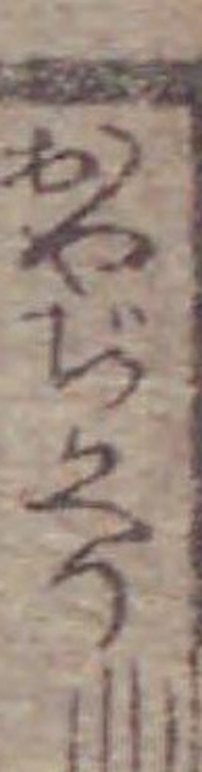おやぢかへり
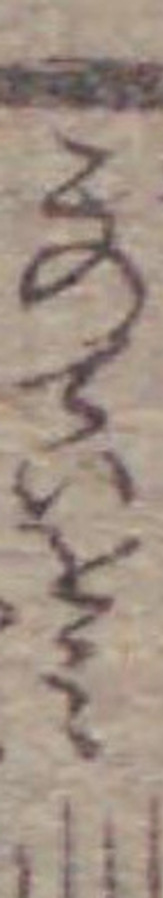このていをみ
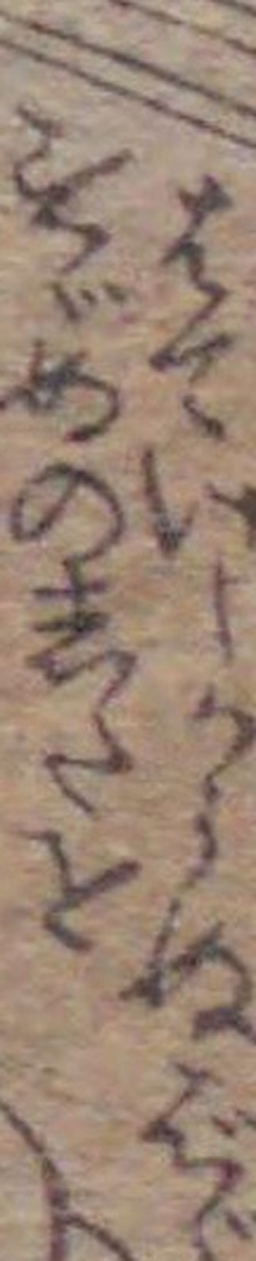すゞめのしたを
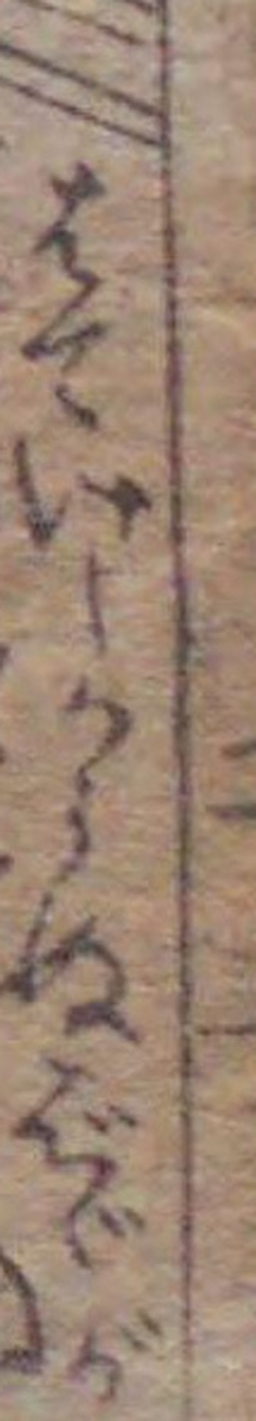はてけしからぬばゞが
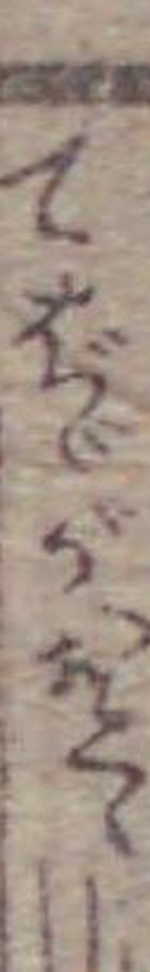てばゞがおとゝ
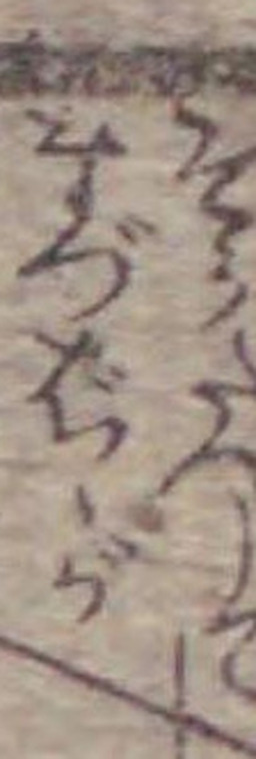まづばゞが
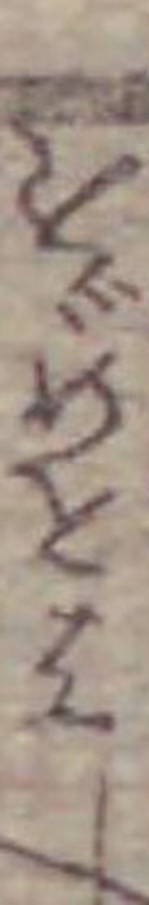すゞめをは
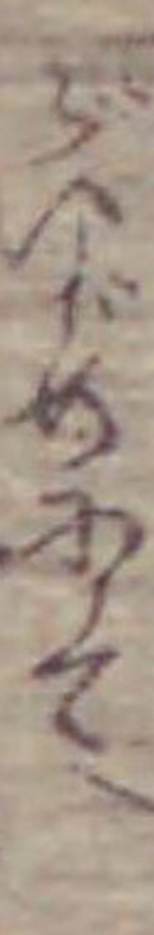がいじめにして
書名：嘘八百温故新知 : 2巻
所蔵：国立国会図書館 National Diet Library, JAPAN
